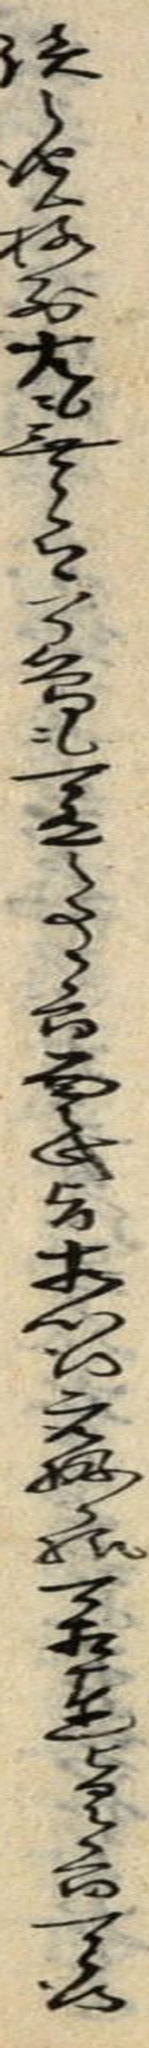談之儀は格別左も無之候はゝ了簡も可有之事に候間面々此旨相心得取扱候様可相達旨に候間可被得
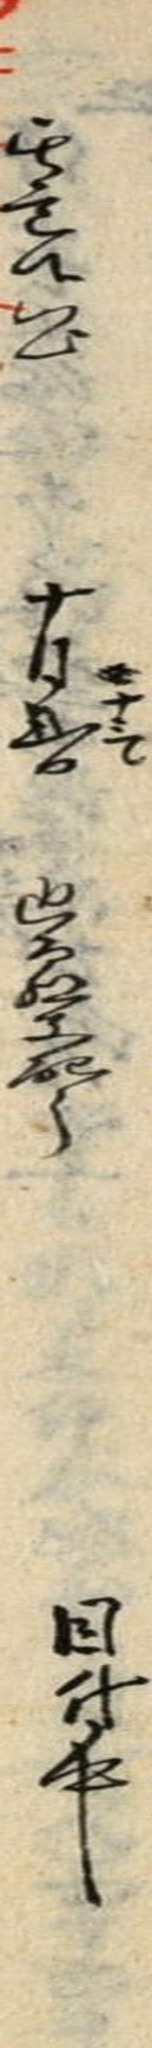其意候以上十月日追而組支配へ目付中
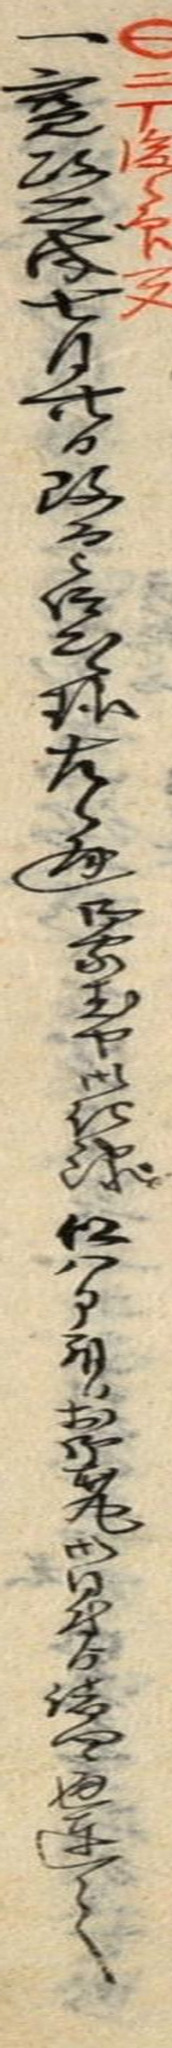一寛政二戌七月廿日改而被仰出候趣左之通御家老中御記録但八月朔日於御本丸御目付ゟ諸向へ通達之
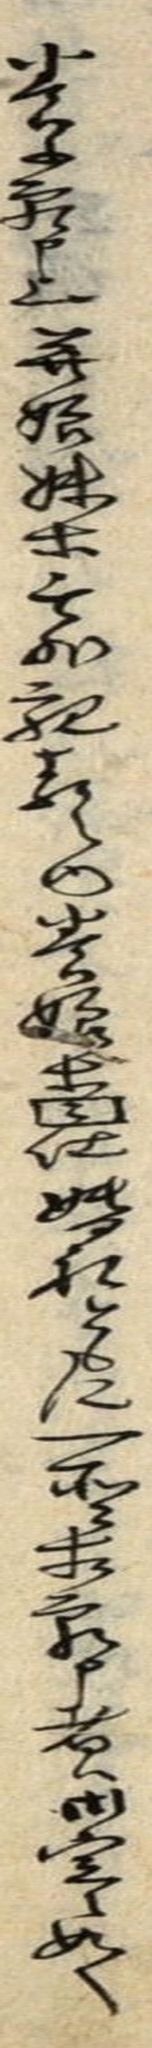養子願申上并娘妹等其外親類之内養娘等々仕婚礼ともに一所に相願申者は御定之如く
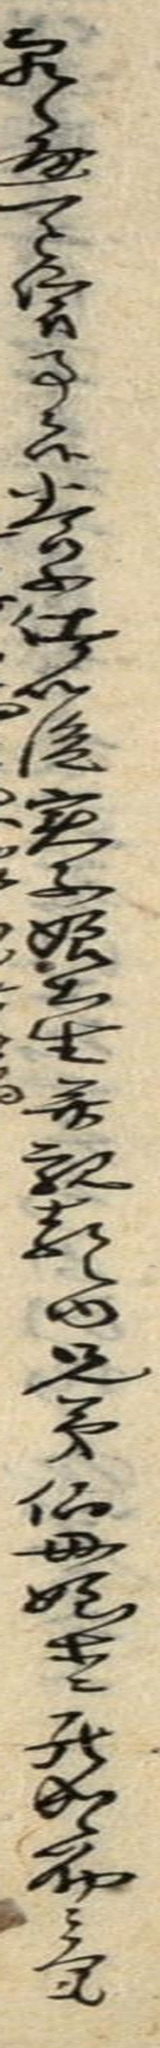願之通可被仰付事に候養子仕り候以後実子娘出生并親類之内兄弟伯母娘等に罷成候筋に而も

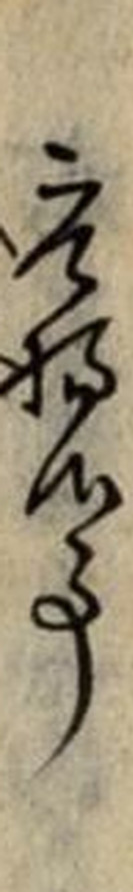取揚候事
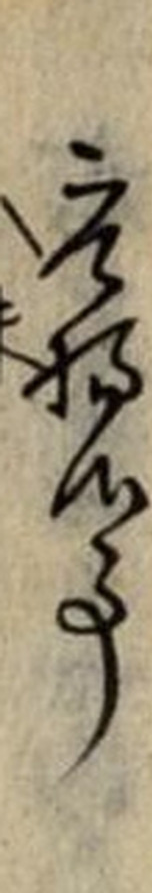取揚候事
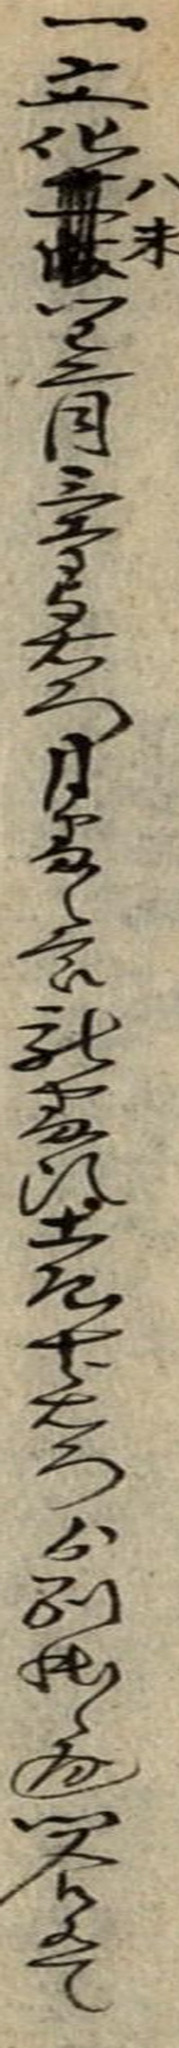一文化八未閏二月三寺与右衛門月番之節新番頭土屋十郎右衛門ゟ別紙之通問合有之
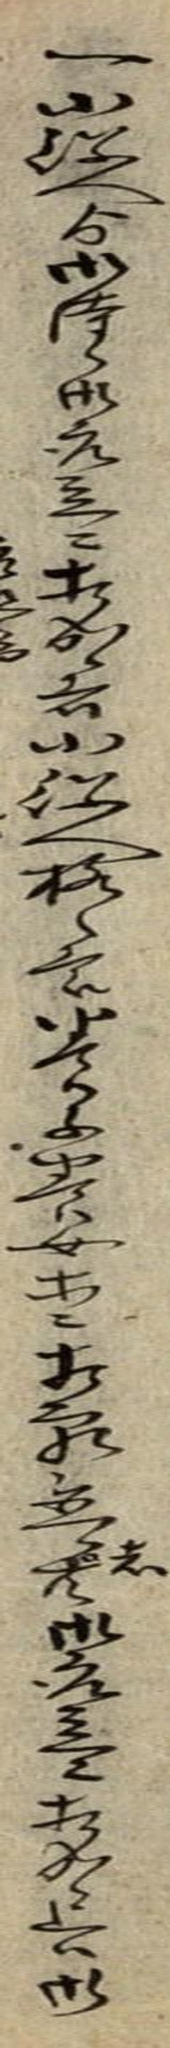一小役人ゟ御侍之御取立ニ相成候者小役人格之節養子養女等ニ相願置候者共御取立ニ相成候上ハ御
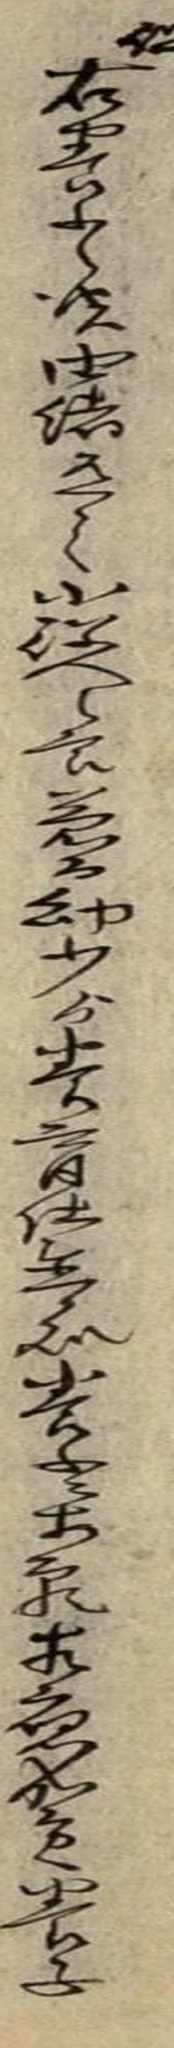右養子之儀由緒有之小役人之節兼而幼少ゟ養育仕置候処養子ニ相願相応成方へ養子
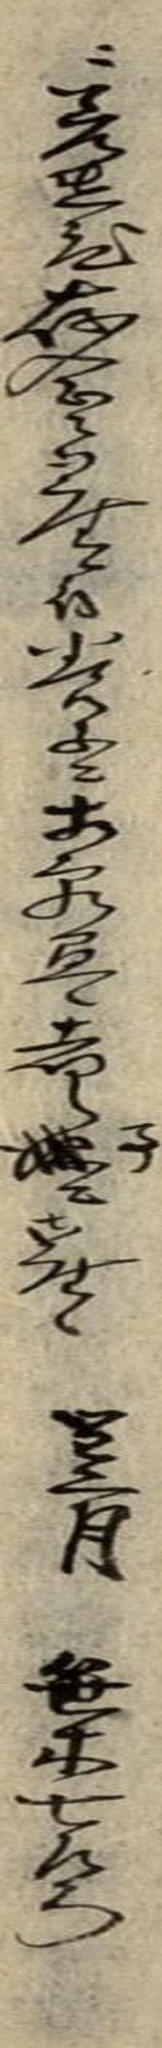ニ差遣度存念に御座候ニ付養子ニ相願置候者之事ニ御座候閏二月笹木七左衛門
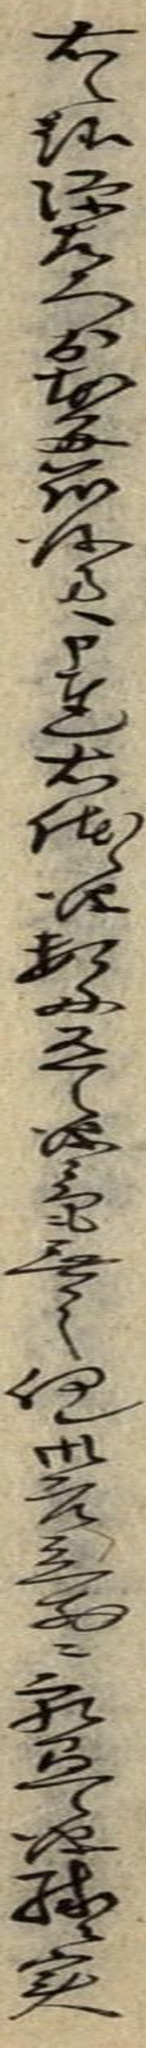右之趣源左衛門ゟ本多筑後方へ申達右体之儀数多有之儀ニ而も無之何レ御取立前ニ願置候儀殊ニ実
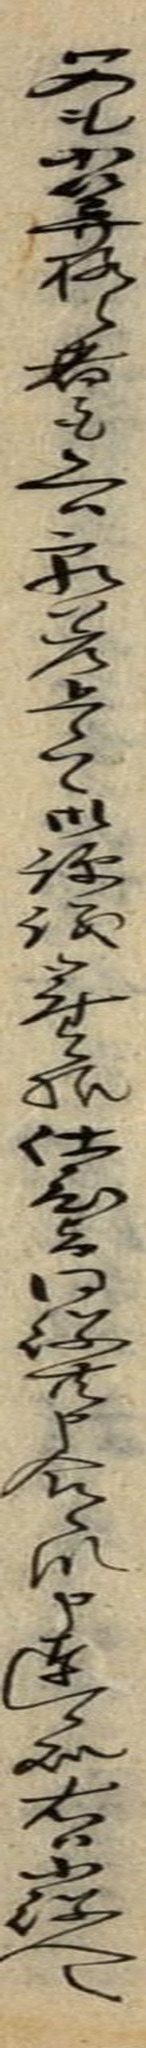父も小算格之者ニも候へハ願差上候ハヽ御評議御座候様仕度旨同役共申合候段申達候処右ハ小役人之
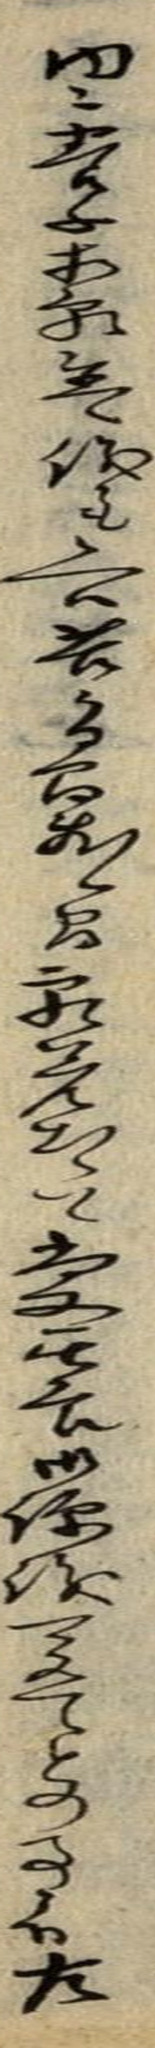内ニ養子相願置候儀ニも候へハ苦かる間敷候間願差出候ハヽ尚又其節御評儀可有之との事ニ付左
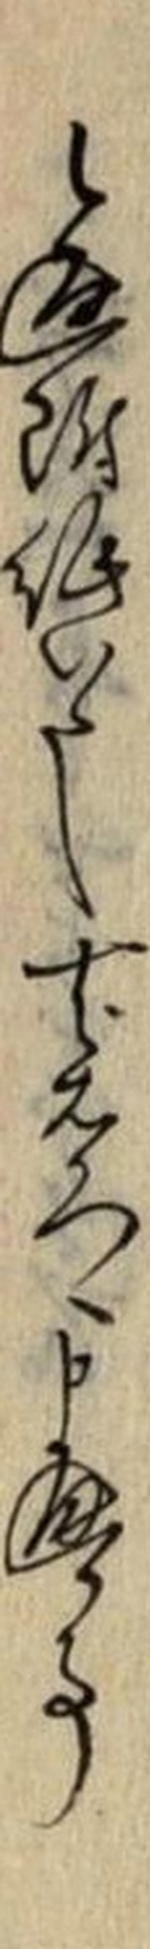之通附紙いたし十郎右衛門へ申通候事
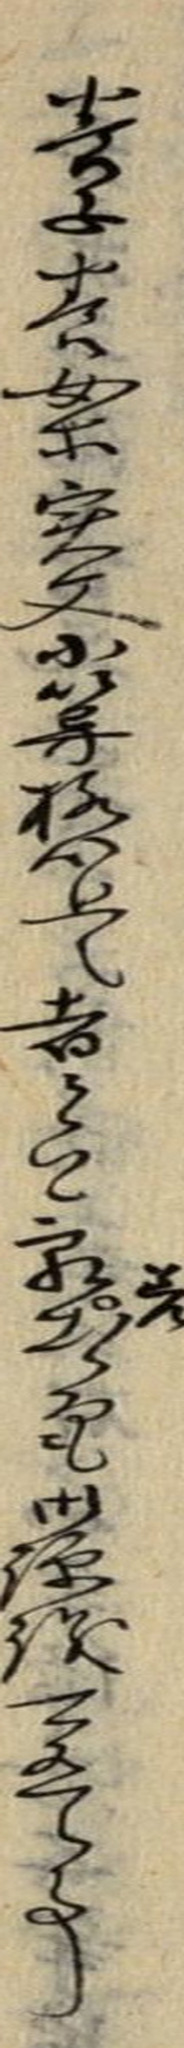養子養女等実父小算格ゟ上之者ニ候ハヽ願差出候而も御評議可有之事
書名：養子縁組之部
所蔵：福井県文書館 Fukui Prefectural Archives
